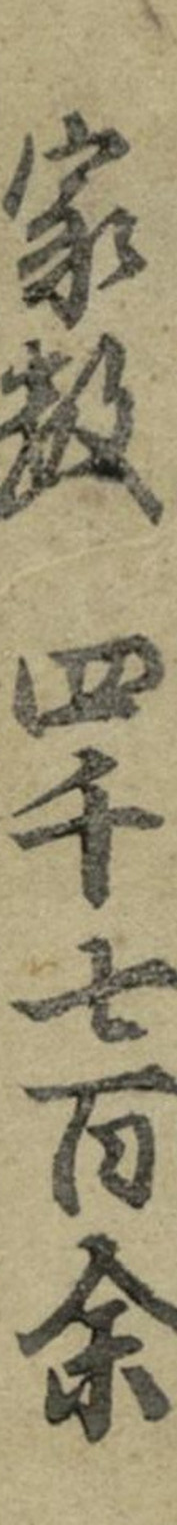家数四千七百余
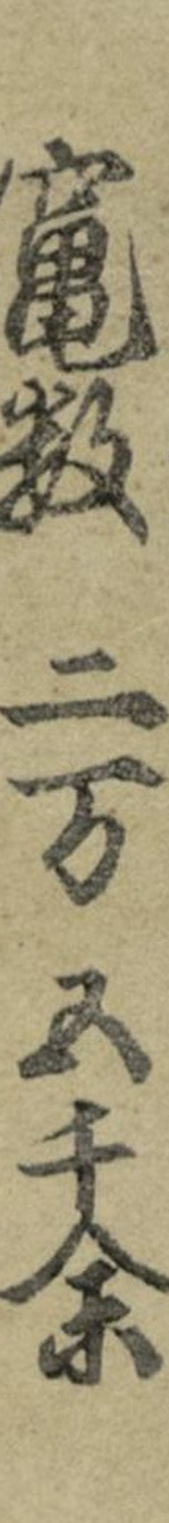竈数二万五千余
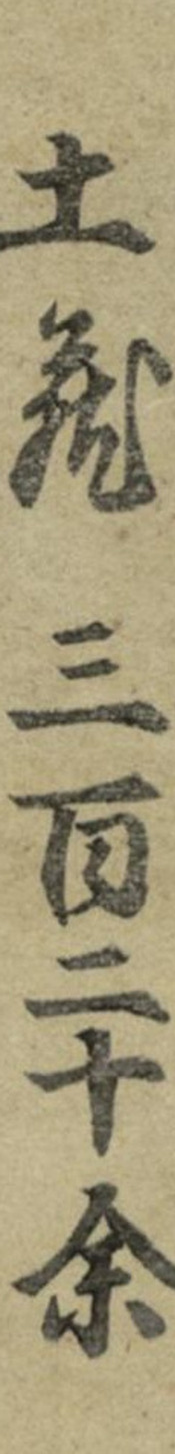土蔵三百二十余
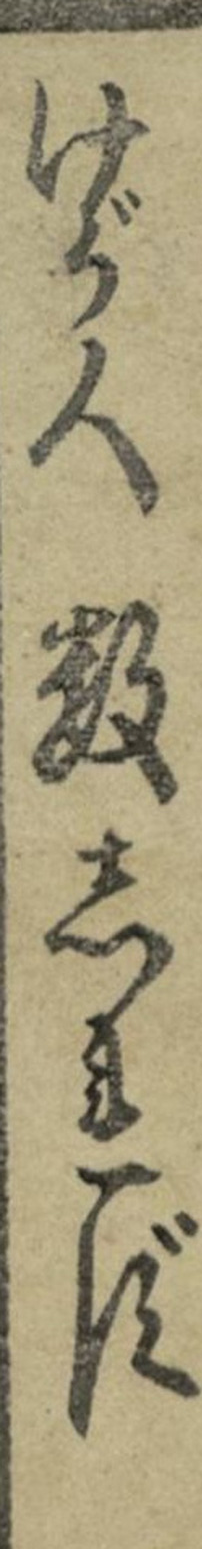けが人数しれず
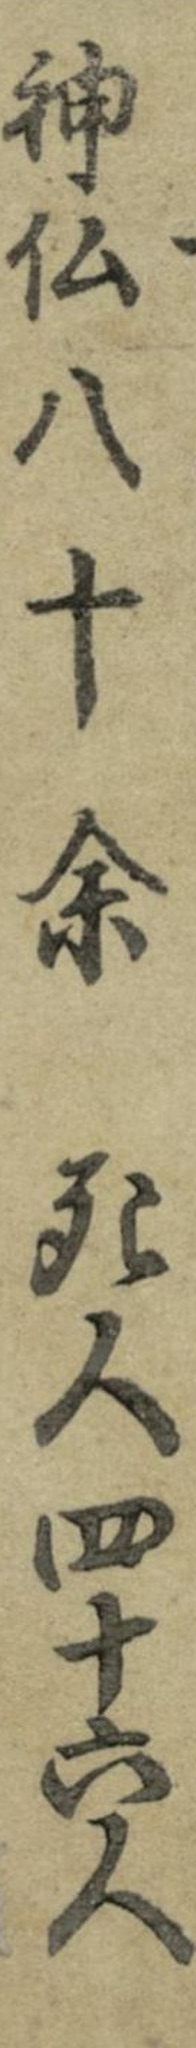神仏八十余死人四十六人
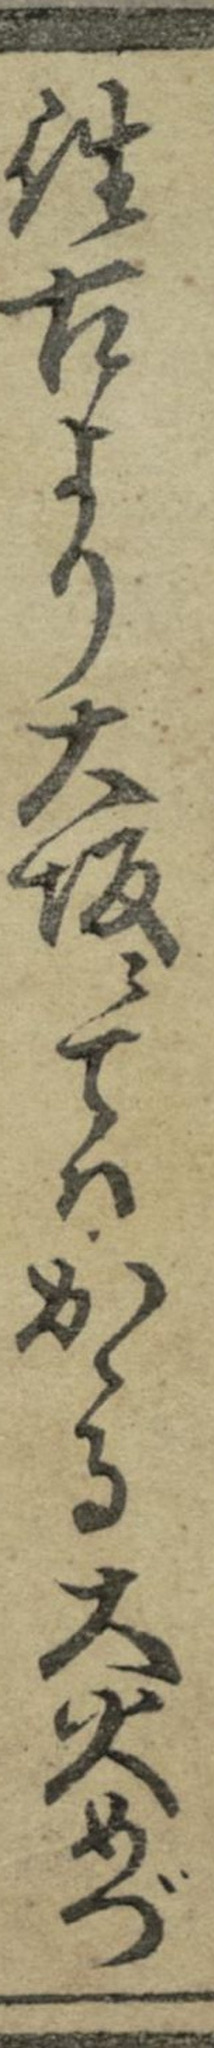往古より大坂にてはかかる大火めづ
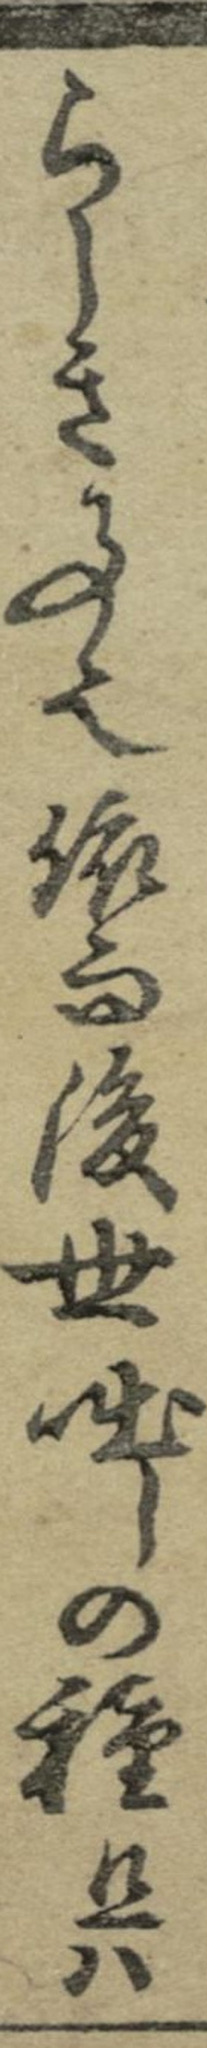らしき事也依而後世咄しの種且は
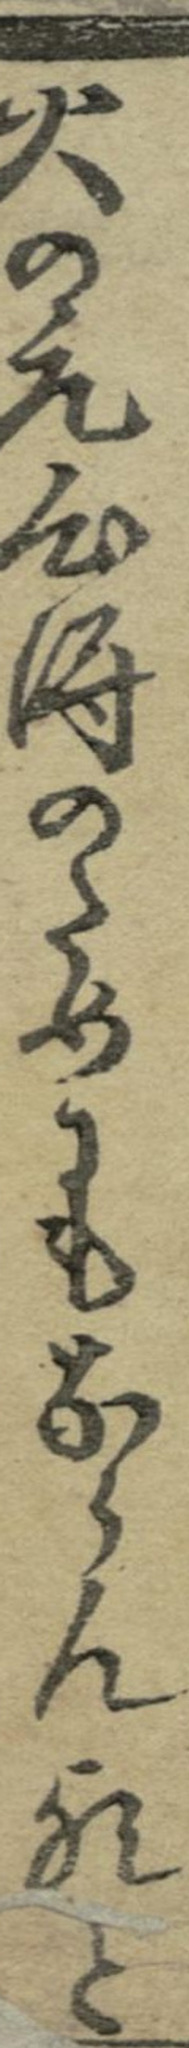火の元心得のためにもならん歟と
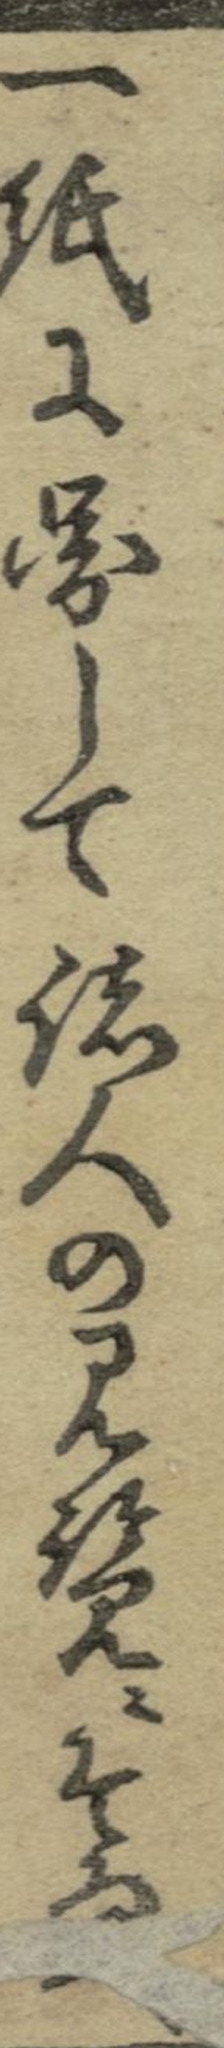一紙に図して諸人見覧にそなへ
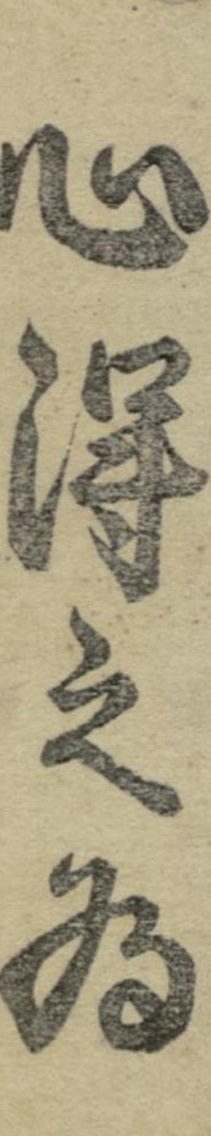心得之為
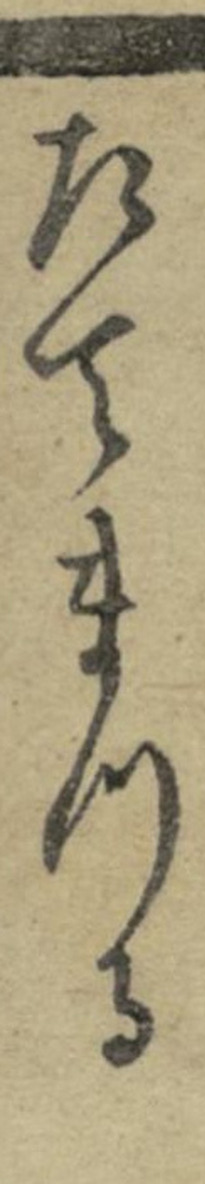たてまつる
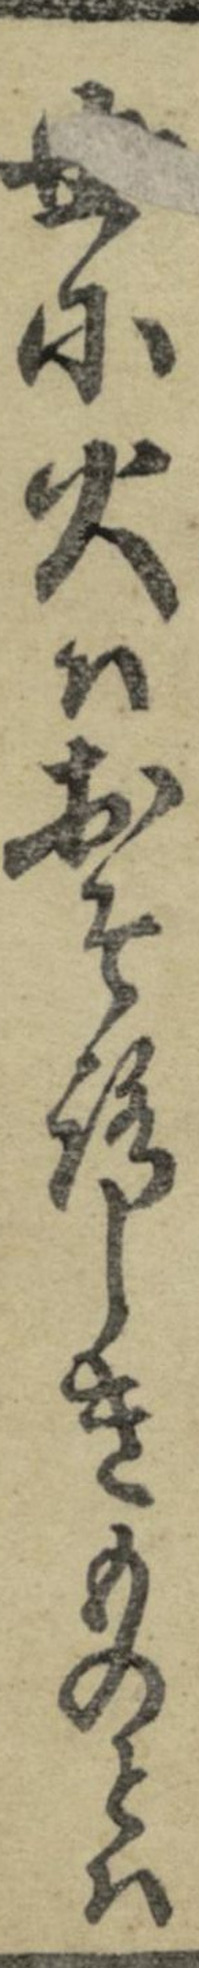世に火はおそろしきものとは
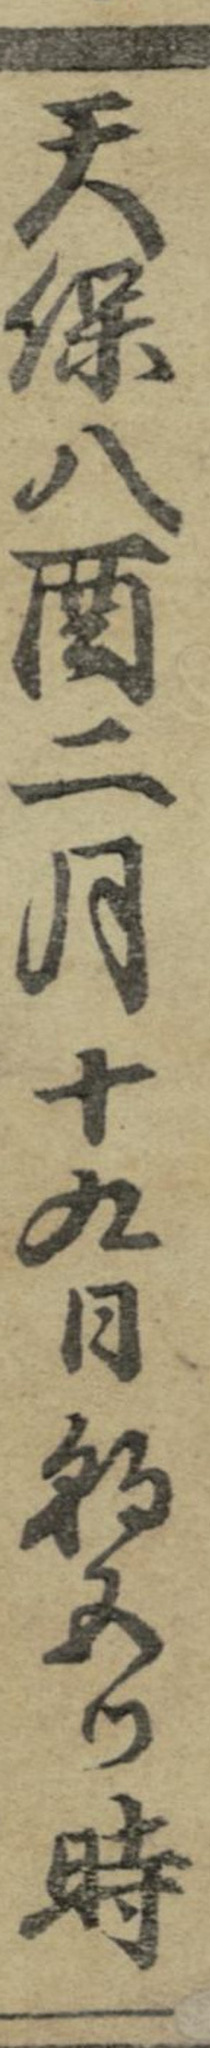天保八酉二月十九日朝五ッ時
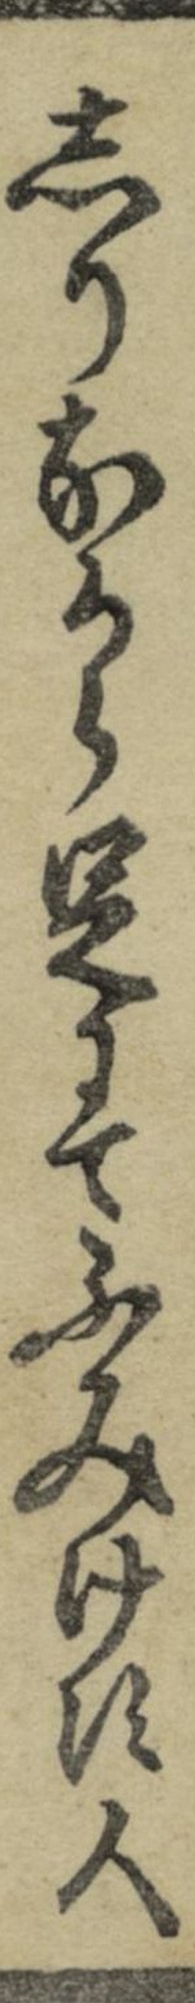しりながら足にてふみけす人
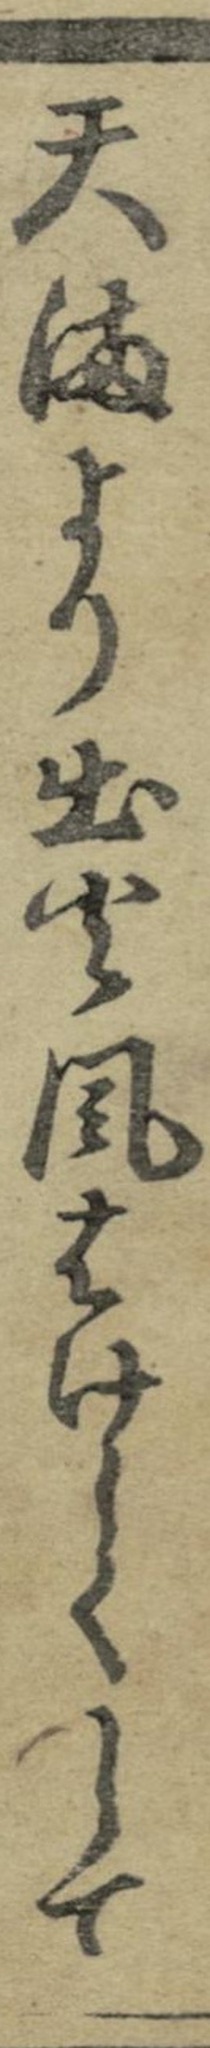天満より出火風はけしくして
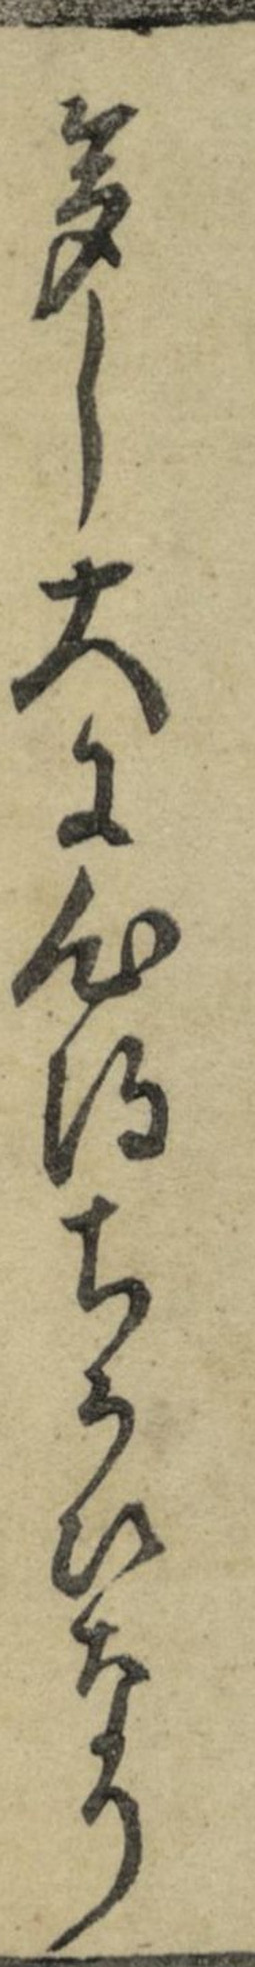多し大に心得ちかいなり
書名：大阪今昔三度の大火
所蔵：東京大学地震研究所図書室 Earthquake Research Institute Library, The University of Tokyo, JAPAN
